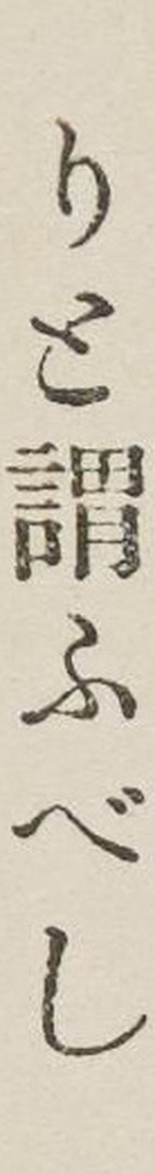りと謂ふべし
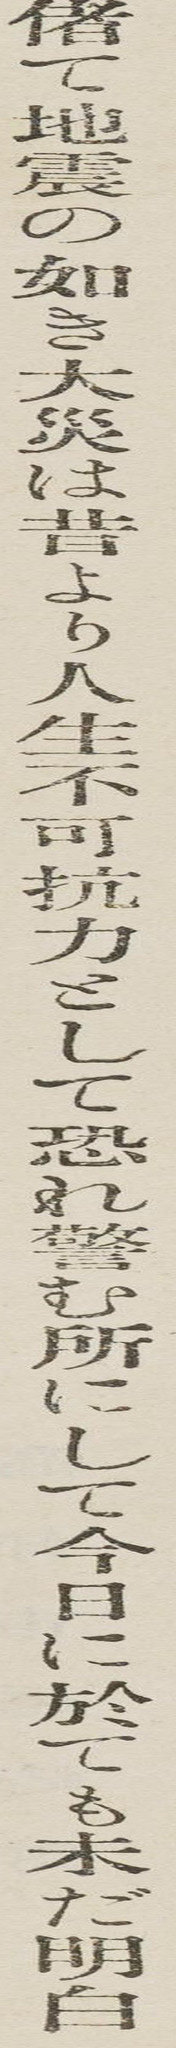偖て地震の如き大災は昔より人生不可抗力として恐れ警む所にして今日に於ても未だ明白
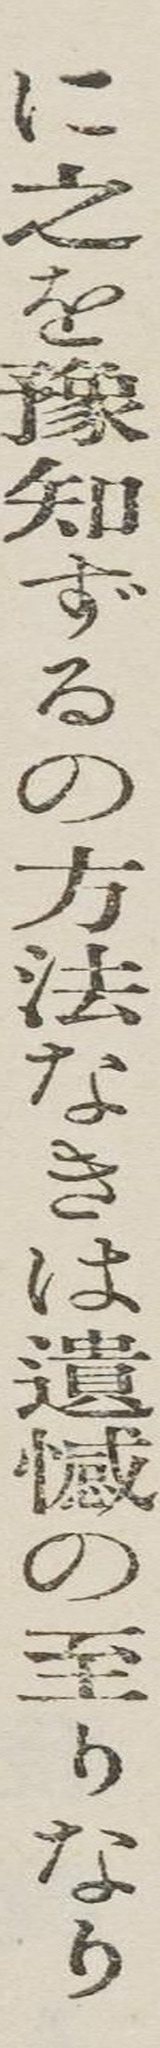に之を予知ずるの方法なきは遺憾の至りなり
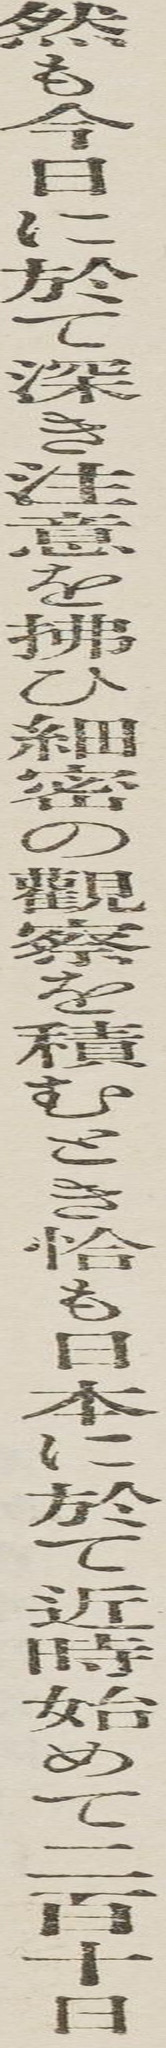然も今日に於て深き注意を払ひ細密の観察を積むとき恰も日本に於て近時始めて二百十日
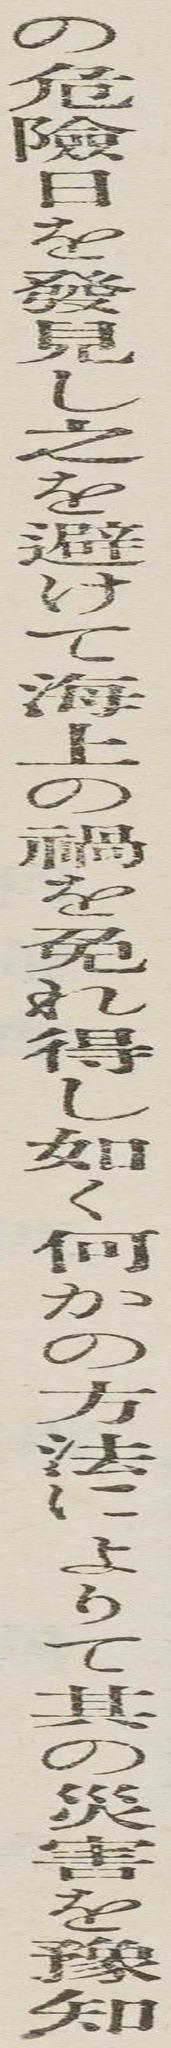の危険日を発見し之を避けて海上の禍を免れ得し如く何かの方法によりて其の災害を予知
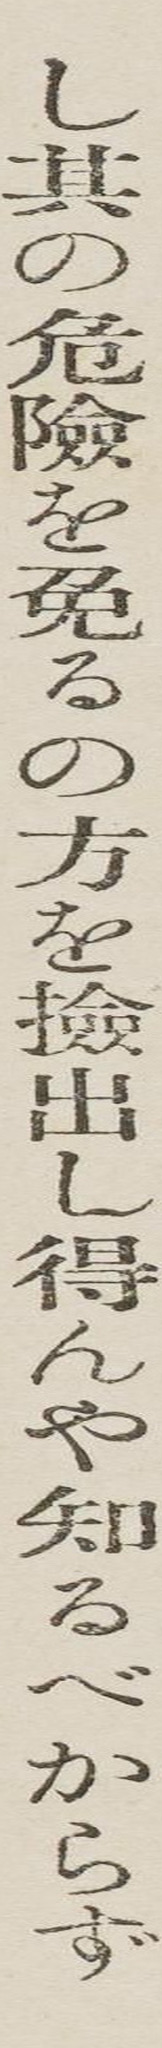し其の危険を免るの方を検出し得んや知るべからず
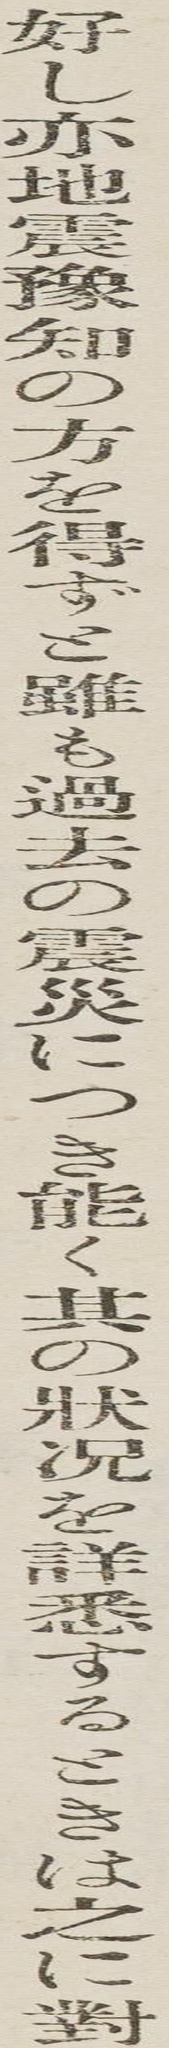好し亦地震予知の方を得ずと雖も過去の震災につき能く其の状況を詳悉するときは之に対
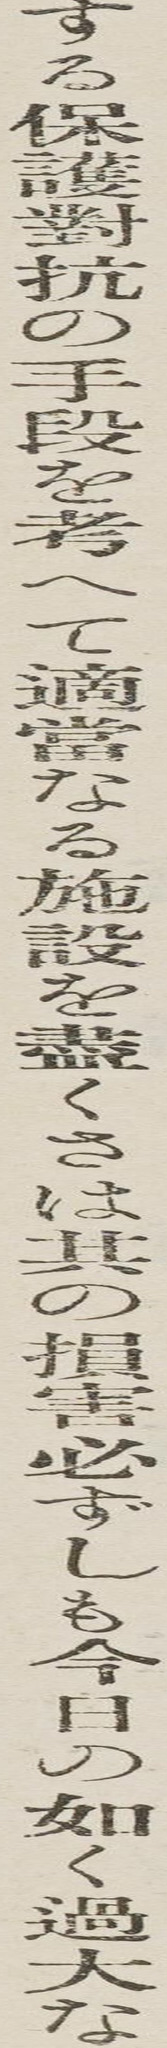する保護対抗の手段を考へて適当なる施設を尽くさは其の損害必ずしも今日の如く過大な
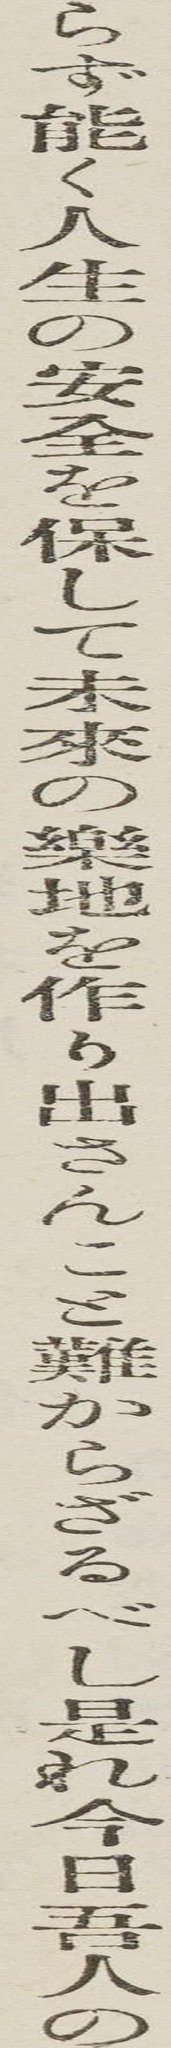らず能く人生の安全を保して未来の楽地を作り出さんとこと難からざるべし是れ今日吾人の
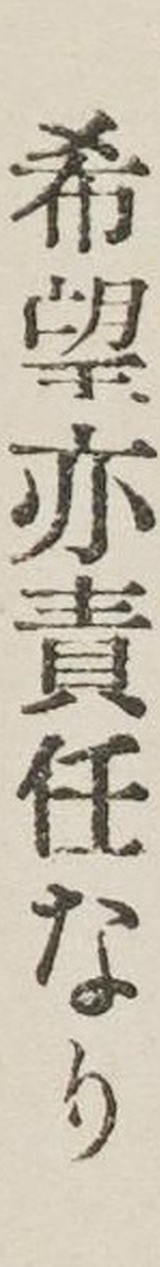希望亦責任なり

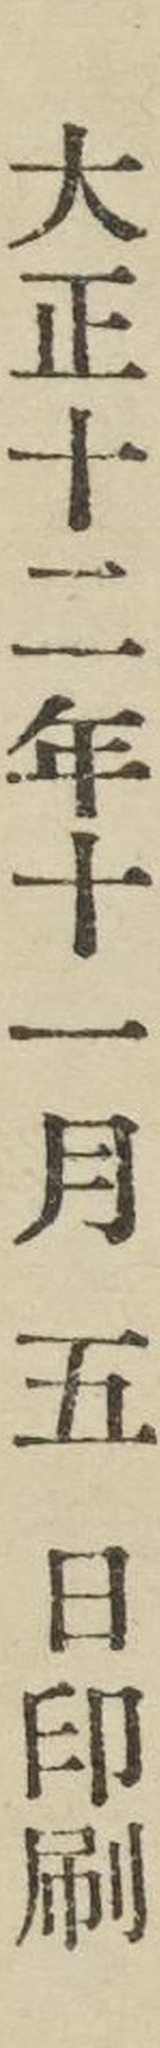大正十二年十一月五日印刷
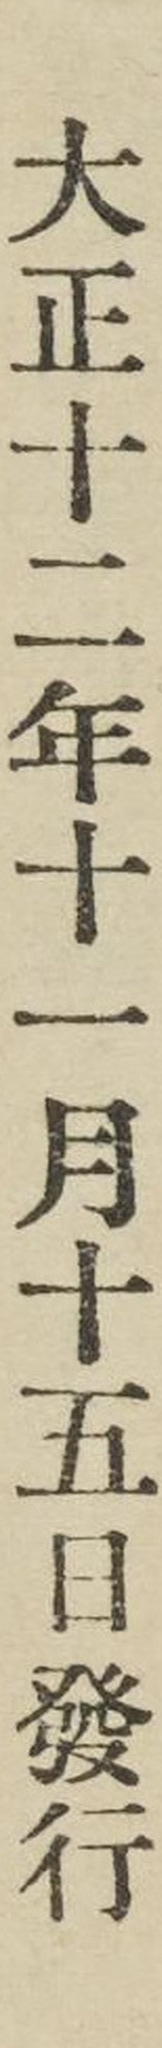大正十二年十一月十五日発行
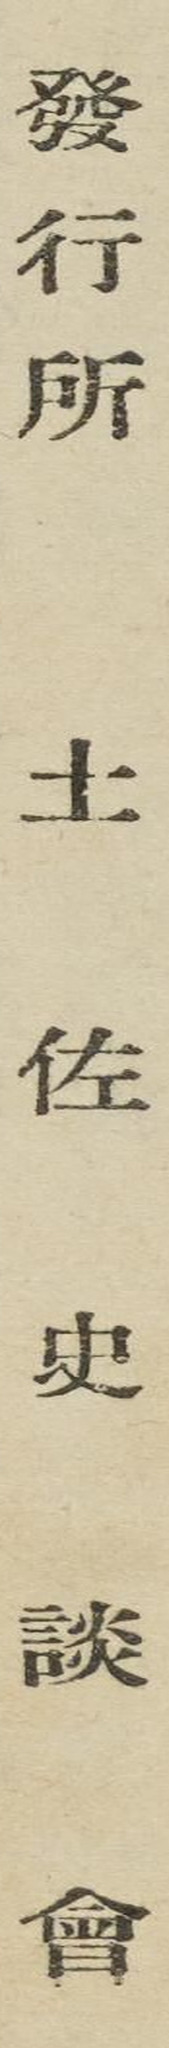発行所土佐史談会
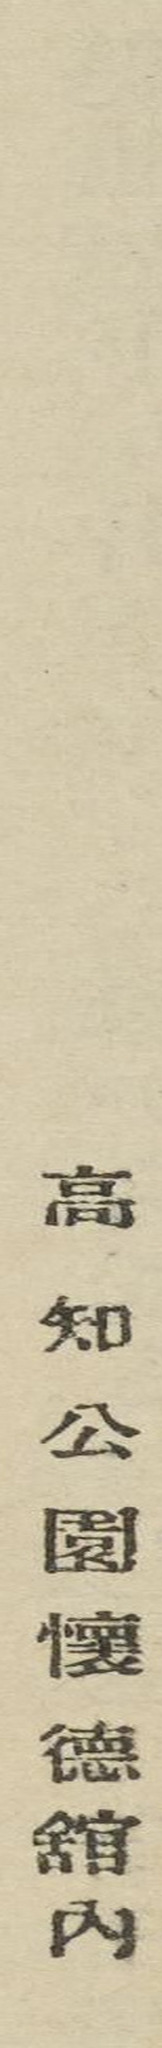高知公園懐徳館内
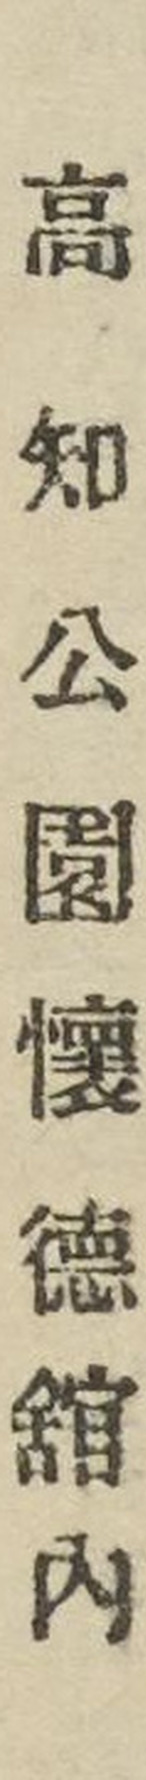高知公園懐徳館内
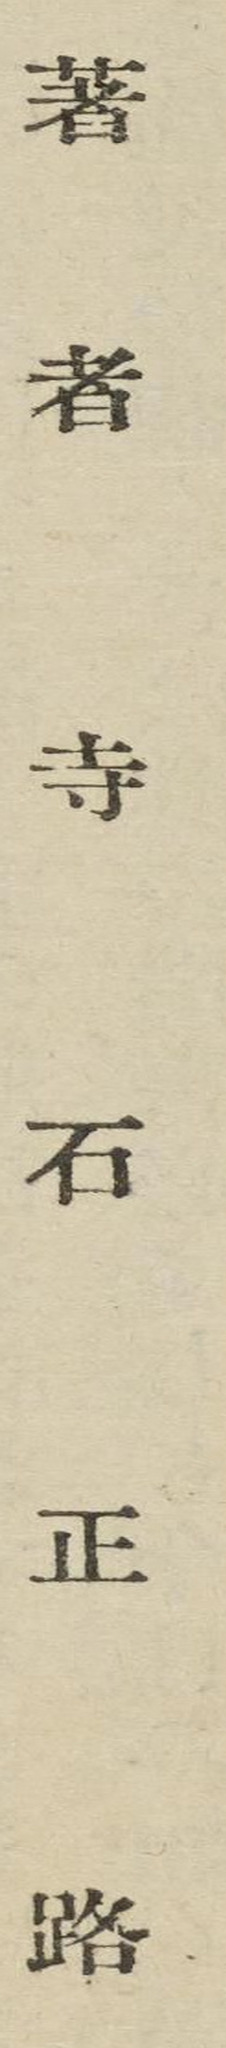著者寺石正路
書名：土佐古今ノ地震
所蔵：東京大学地震研究所図書室 Earthquake Research Institute Library, The University of Tokyo, JAPAN
